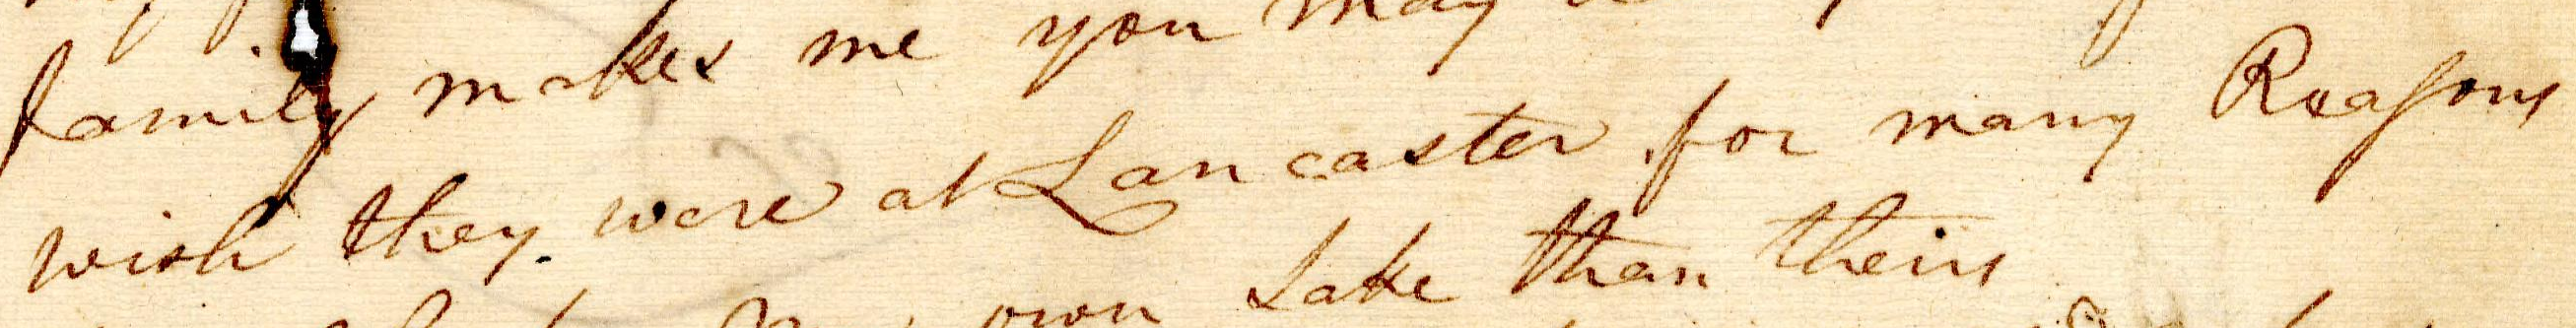wish they were at Lancaster for many Reasons
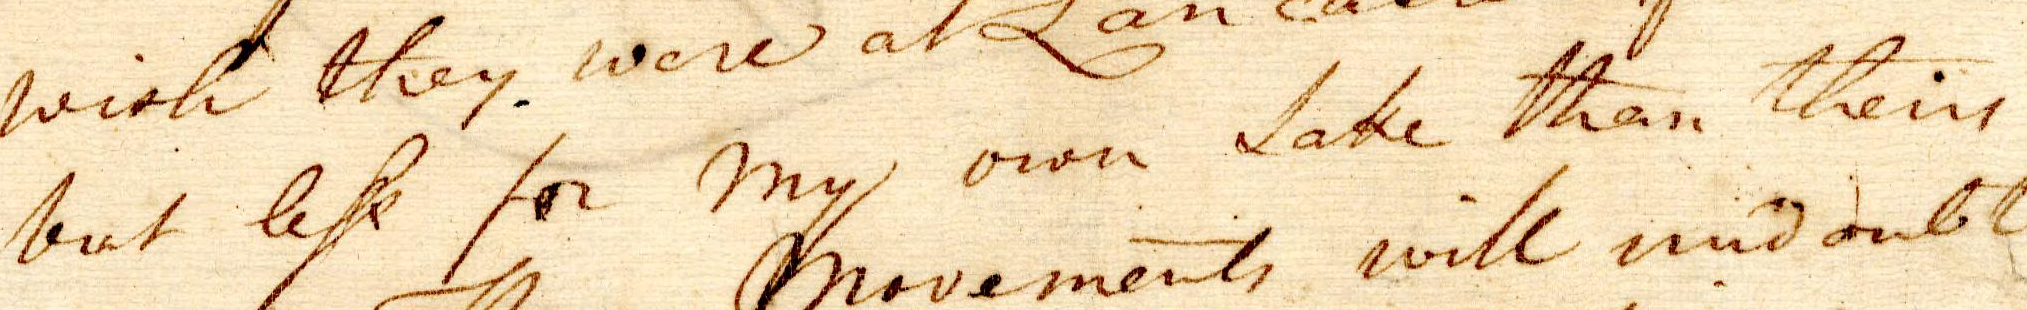but less for my own Sake than theirs
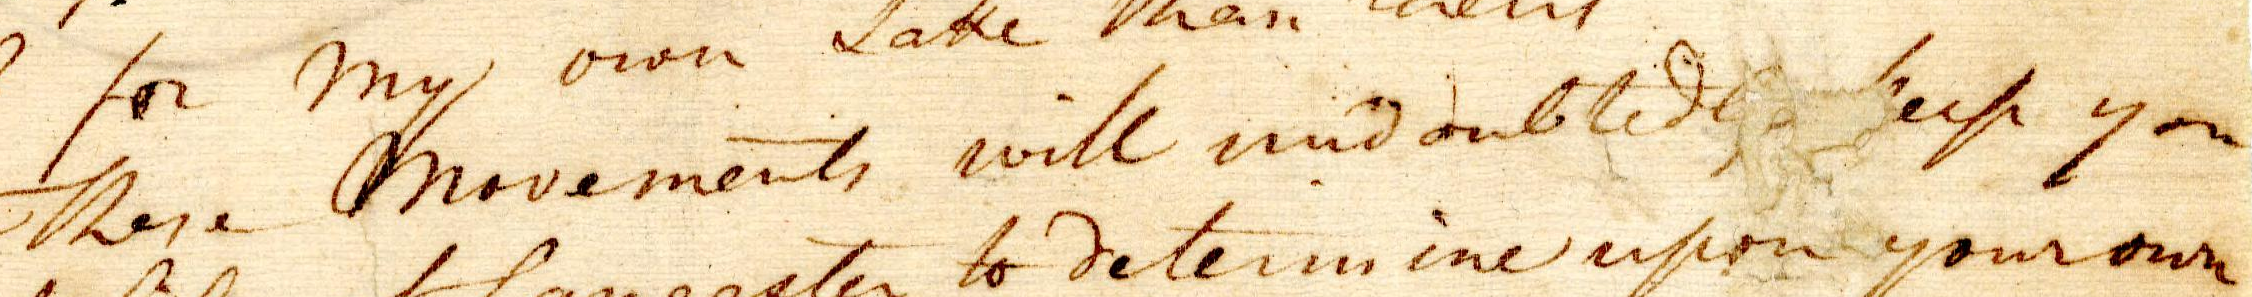These movements will undoubtedly keep you
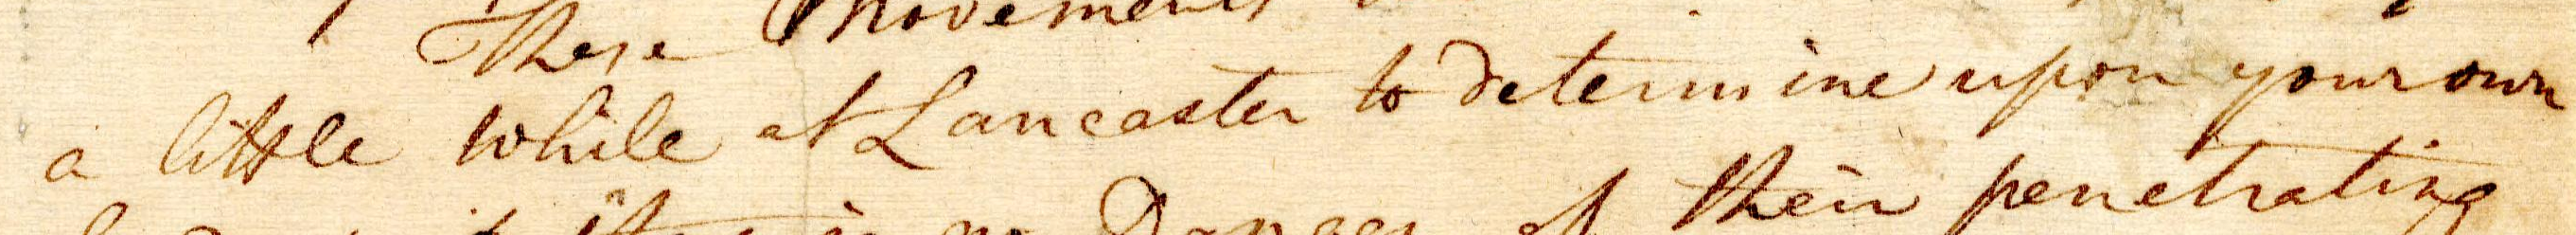a little while at Lancaster to determine upon your own
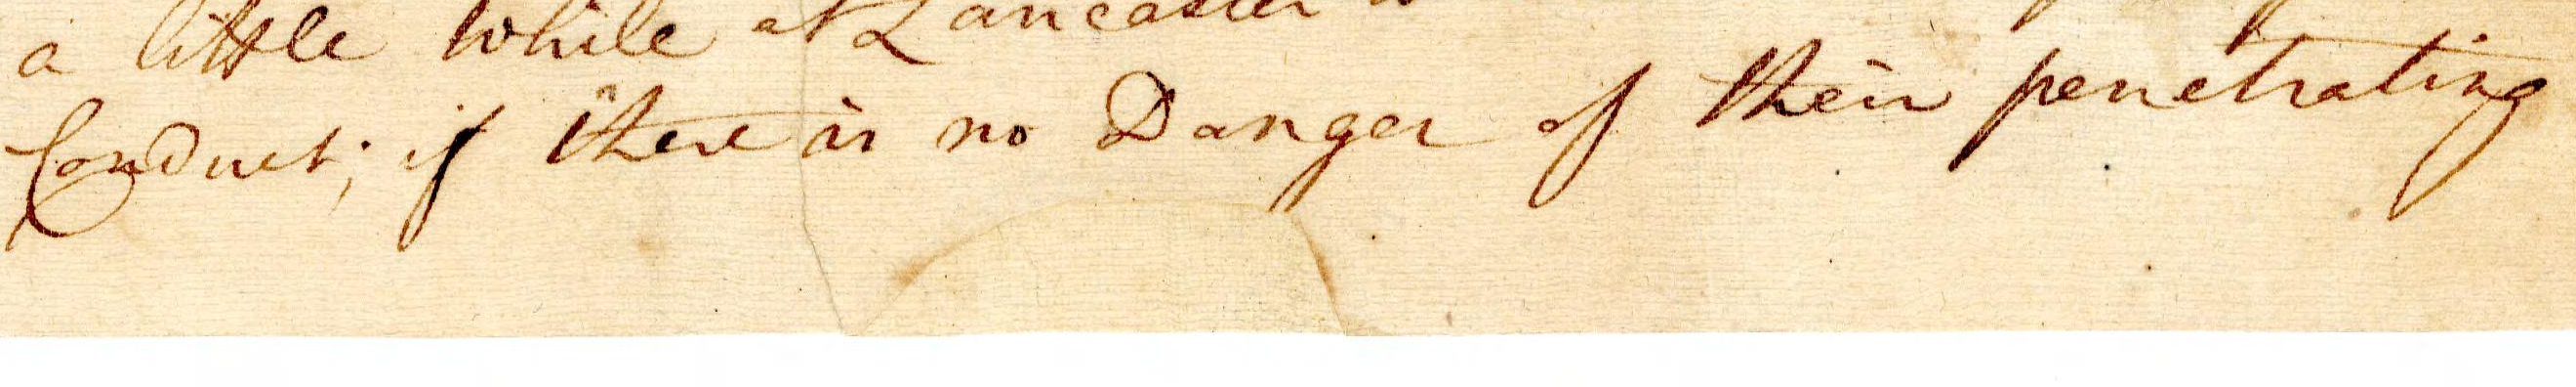Conduct; if there is no Danger of their penetrating
